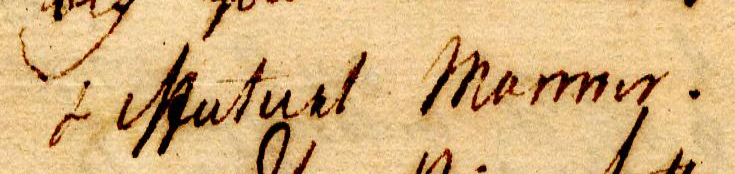& effectual Manner.
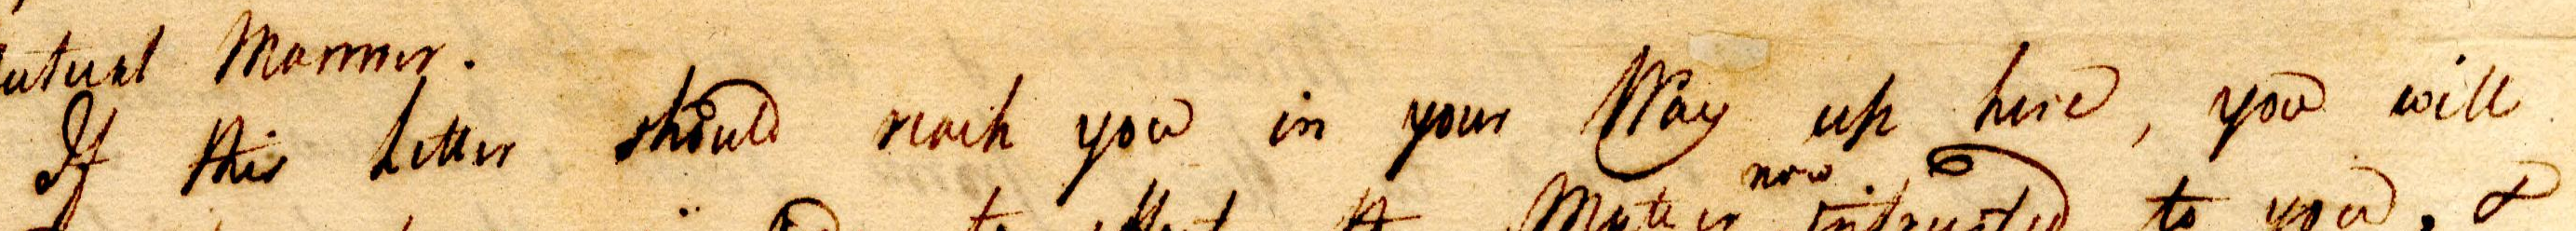If this Letter should reach you in your Way up here, you will
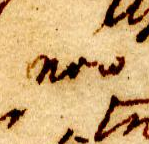now
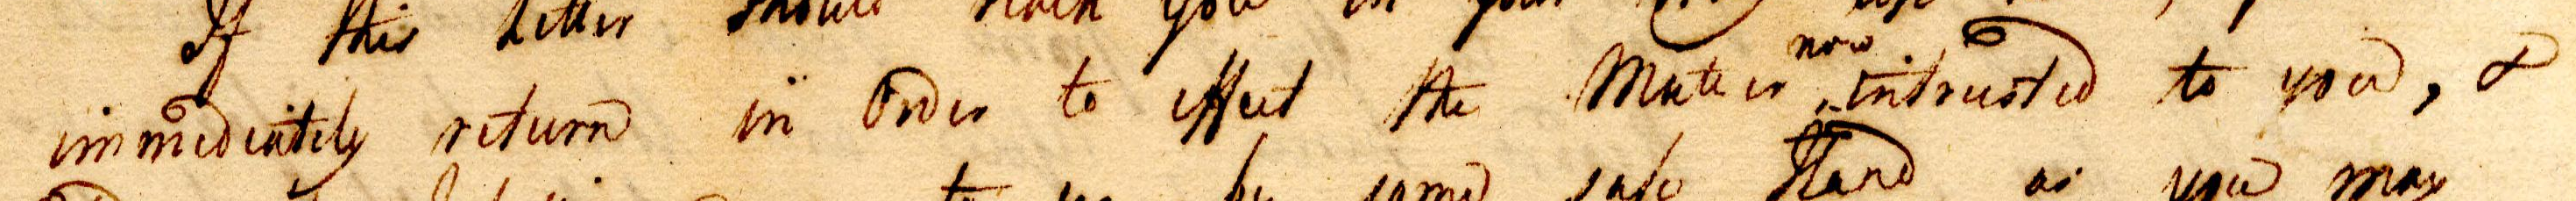immediately return in Order to effect the Matter ^ intrusted to you, &
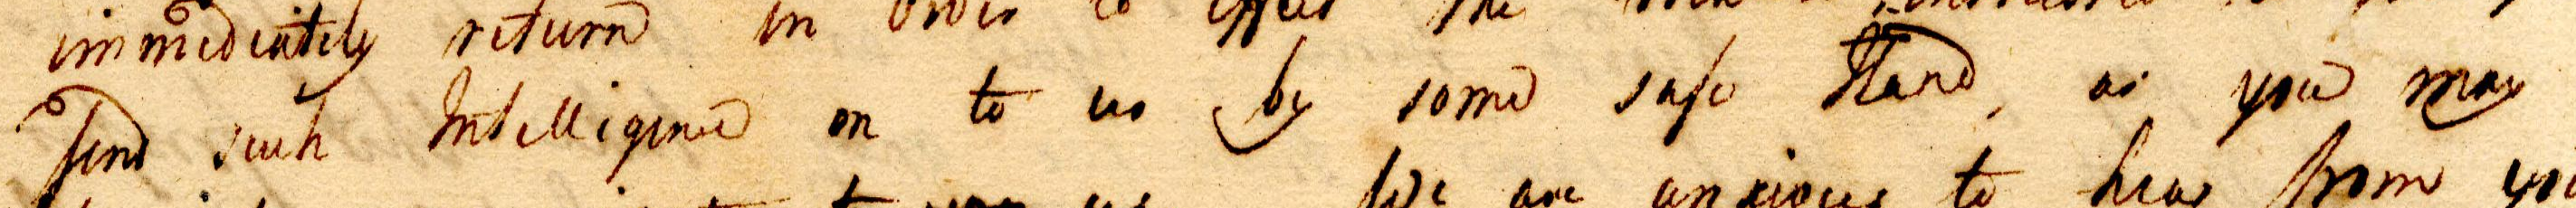send such Intelligence on to us by some safe Hand, as you may
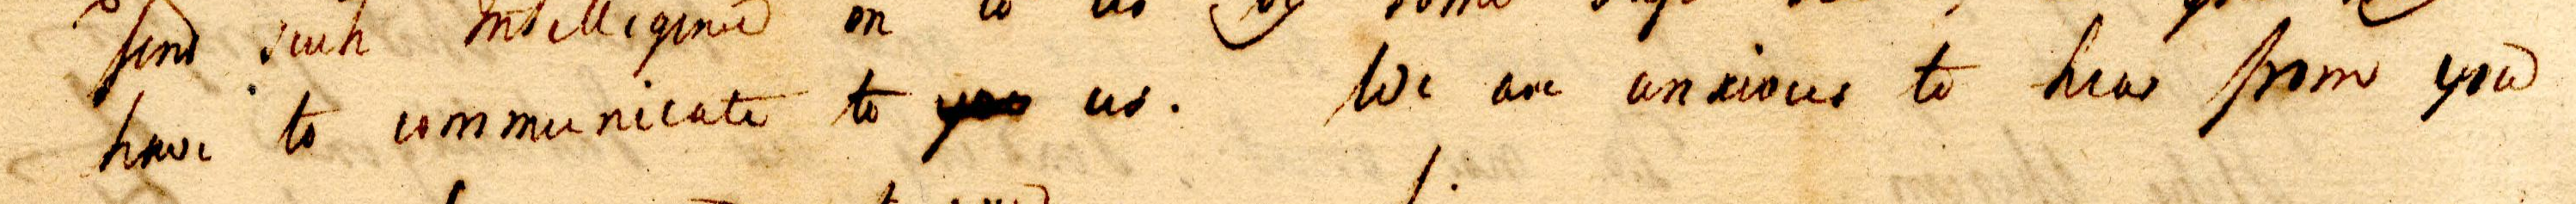have to communicate to you us. We are anxious to hear from you
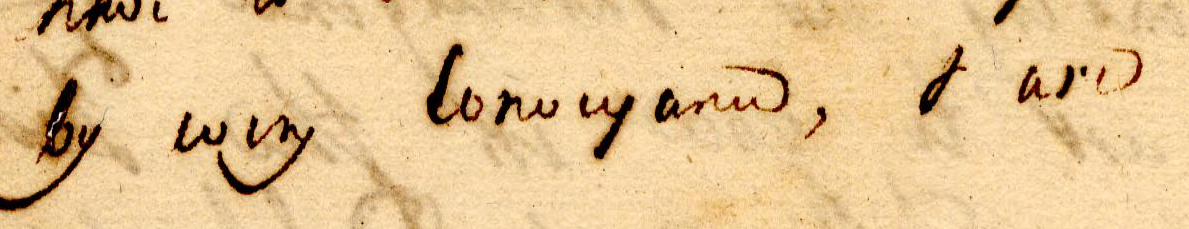by every Conveyance, & are
